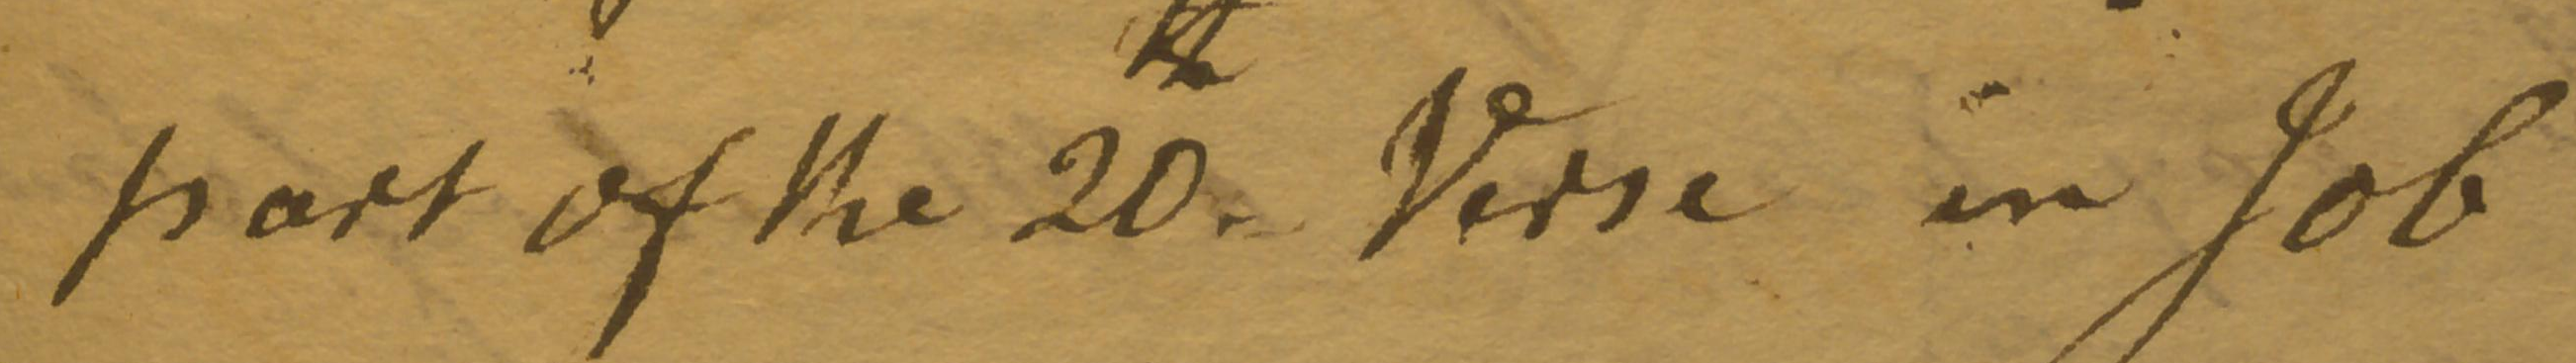part of the 20^th. Verse in Job
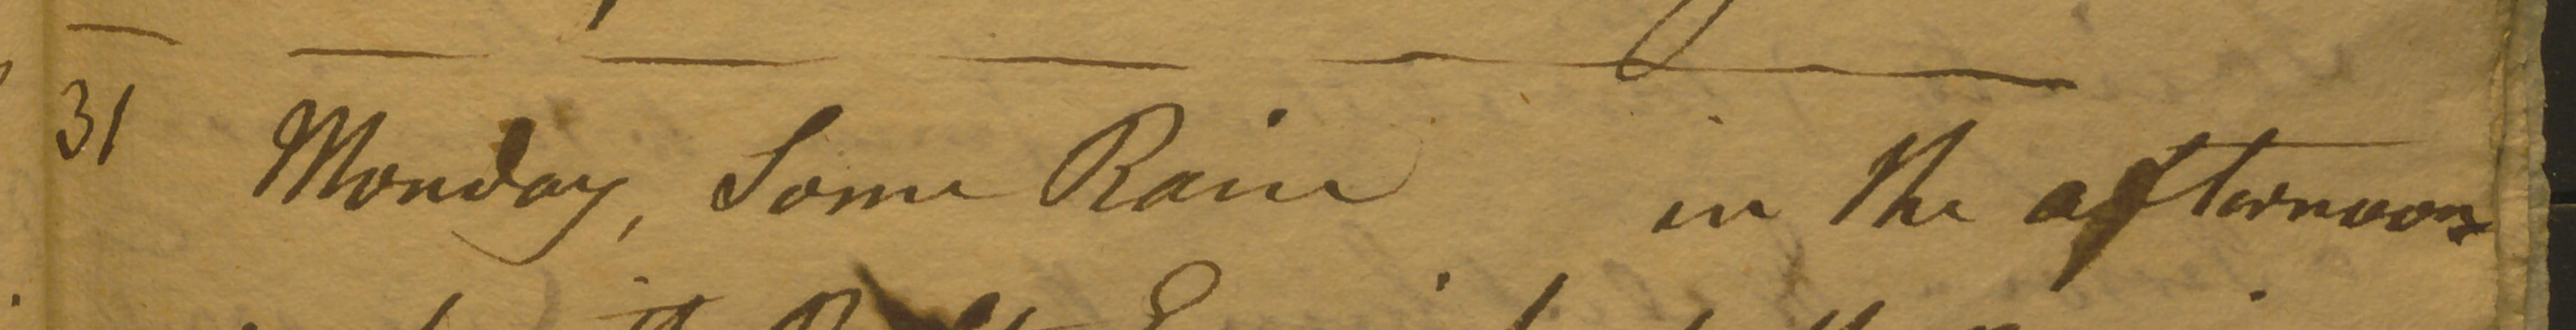31 Monday, Some Rain in the afternoon
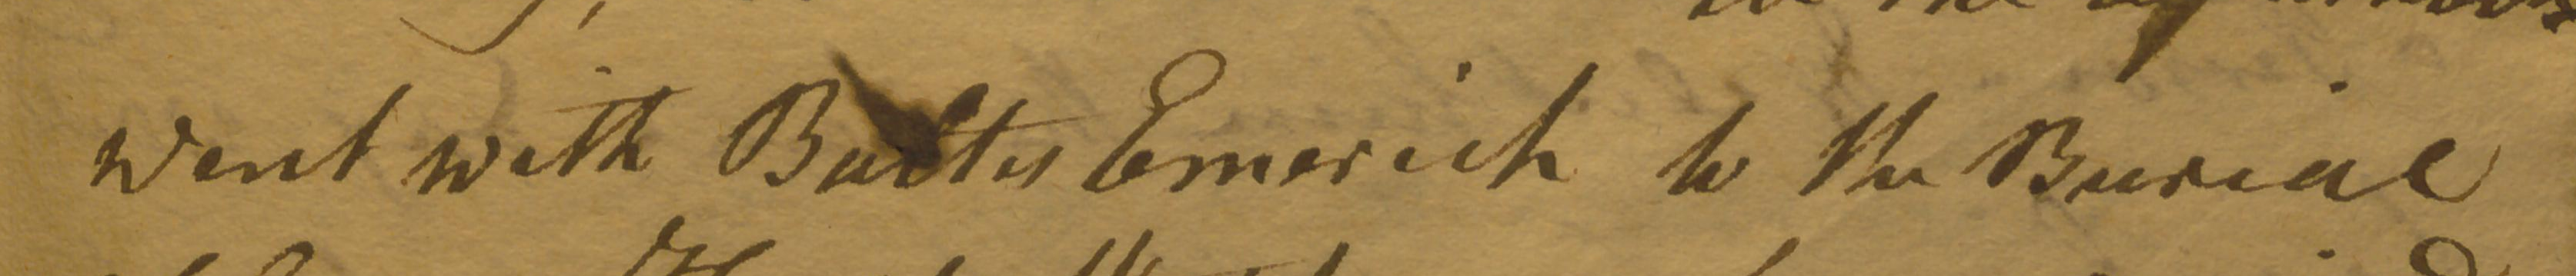went with Baltes Emerich to the Burial
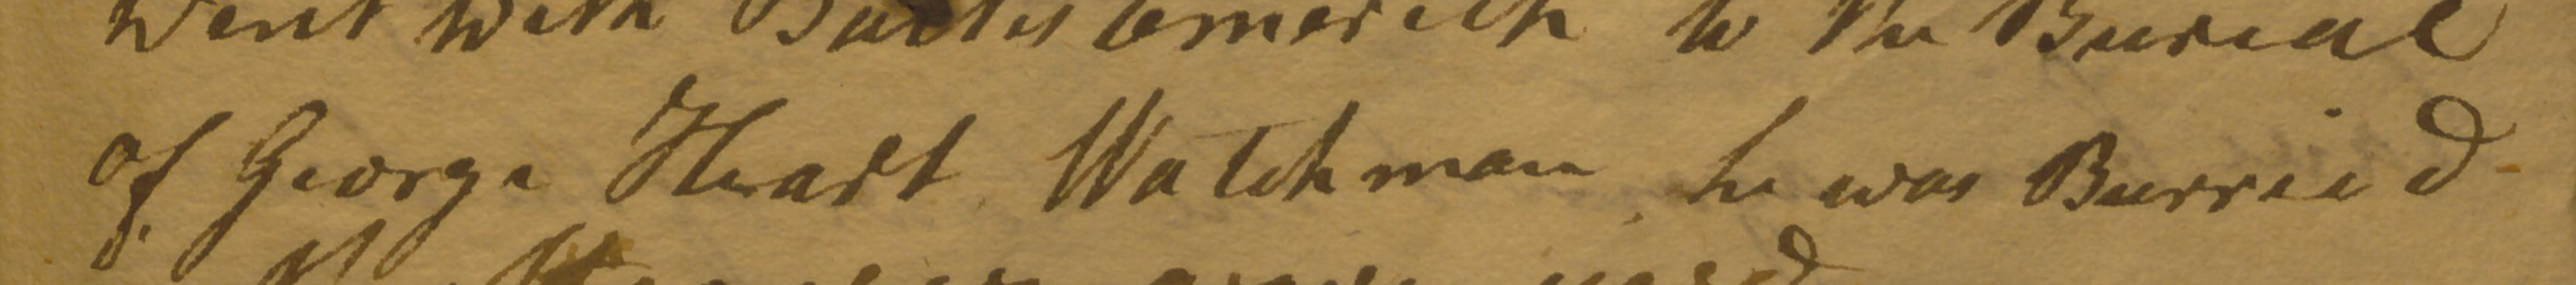of George Heart Watchman he was Burried
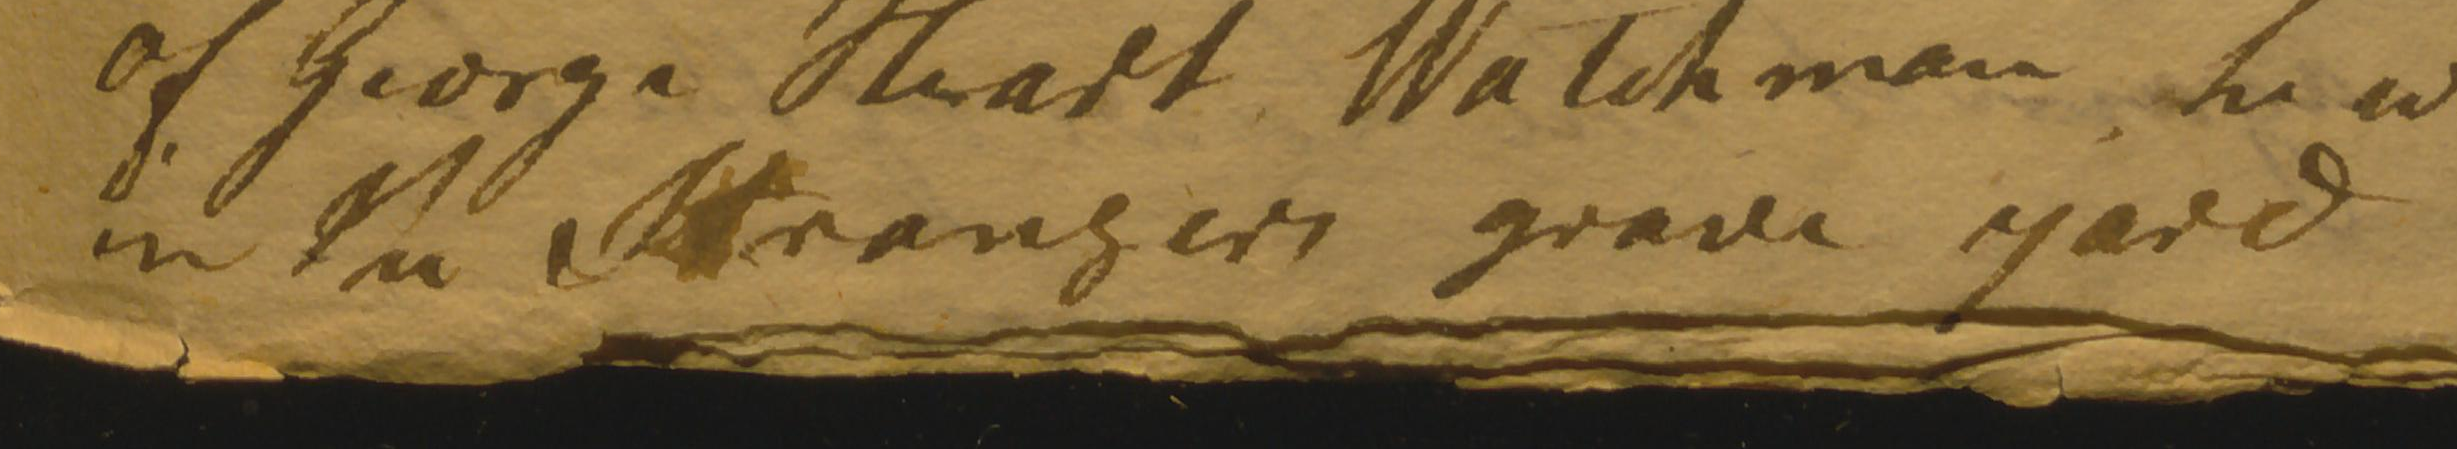in the strangers grave yard
